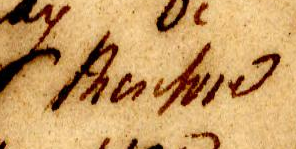therefore
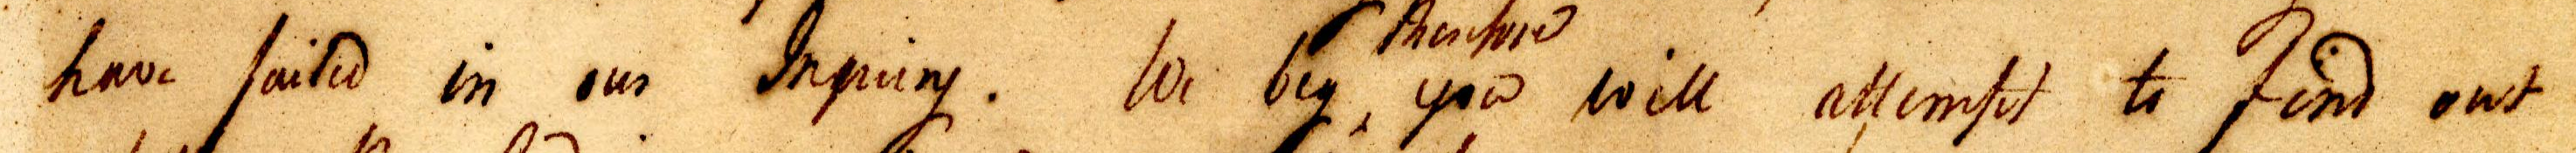have failed in our Inquriy. We beg ^ you will attempt to find out
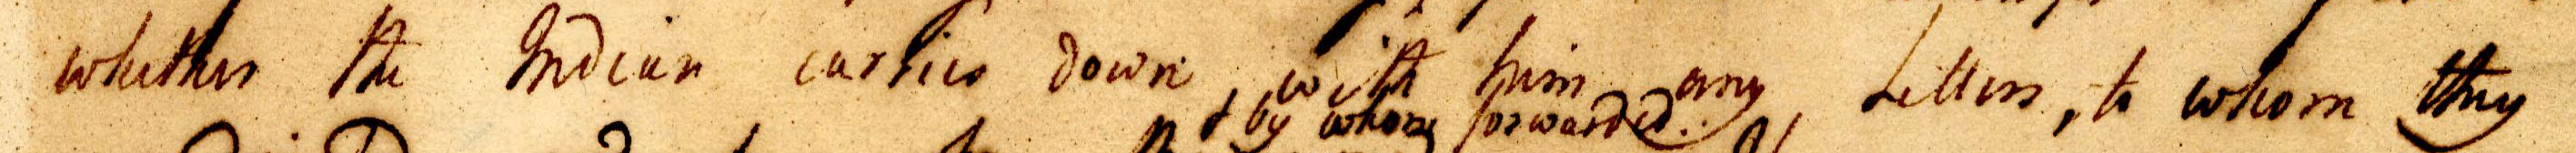whether the Indian carries down with him any Letters, to whom they
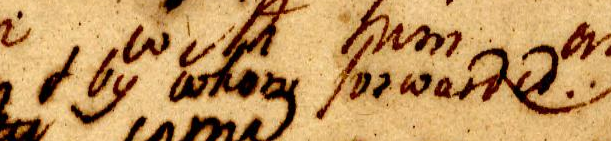& by whom forwarded.
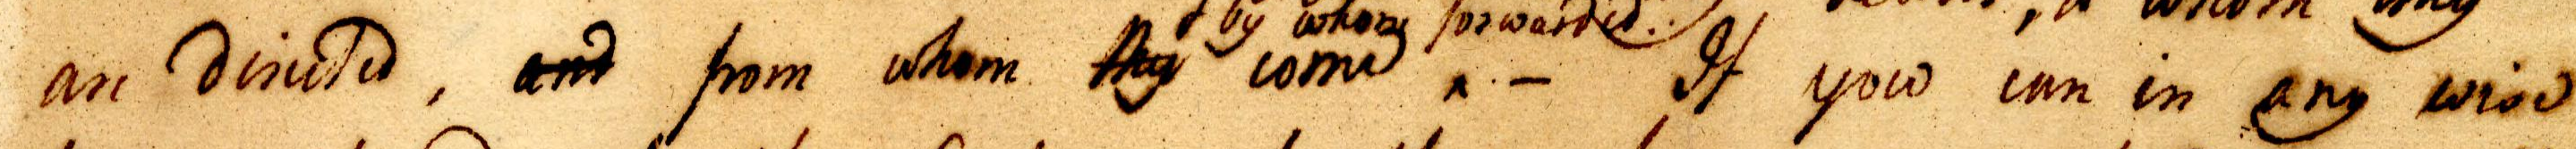are directed, and from whom they come ^ - If you can in any wise
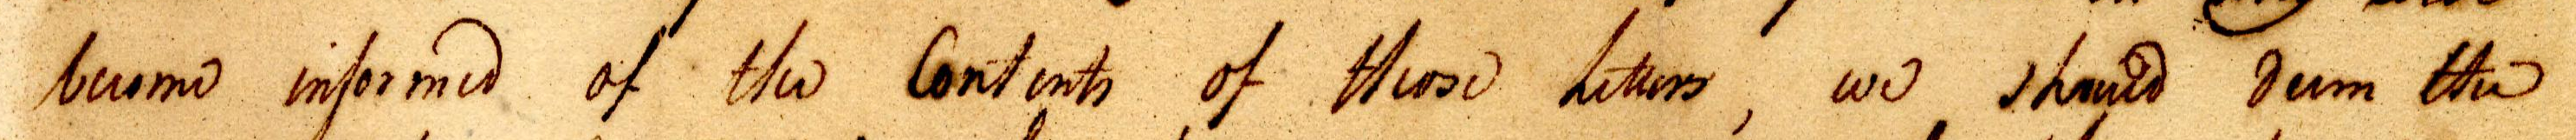become informed of the Contents of those Letters, we should deem the
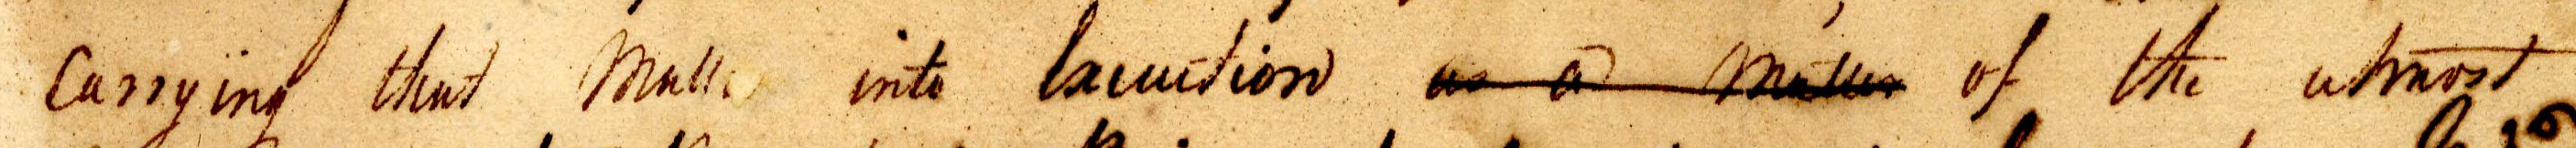carrying that Matter into Execution as a matter of the utmost
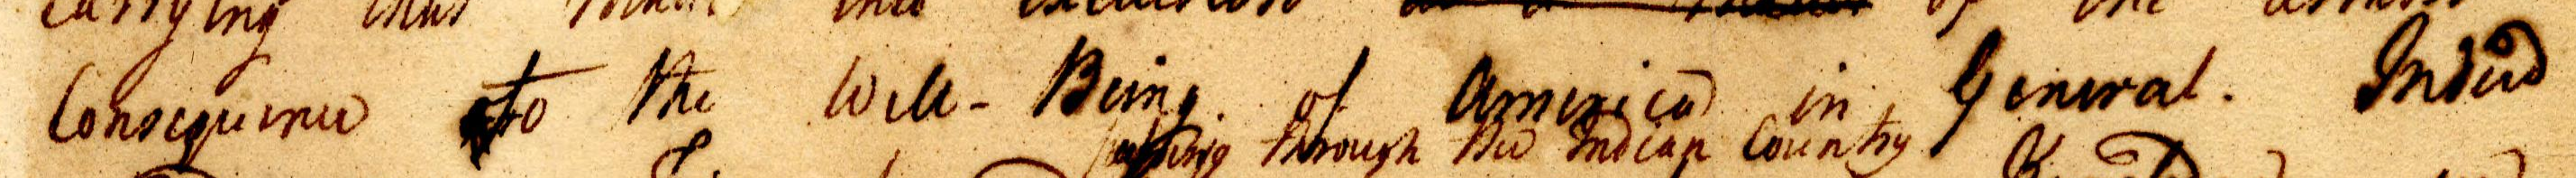Consequence to the Well- Being of America in General. Indeed
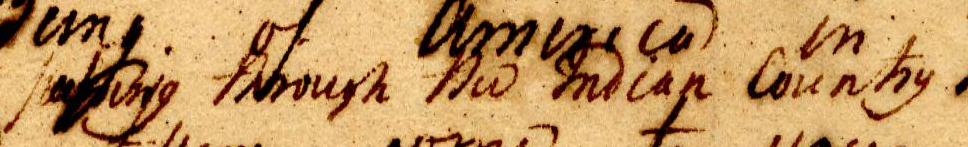passing through the Indian Country
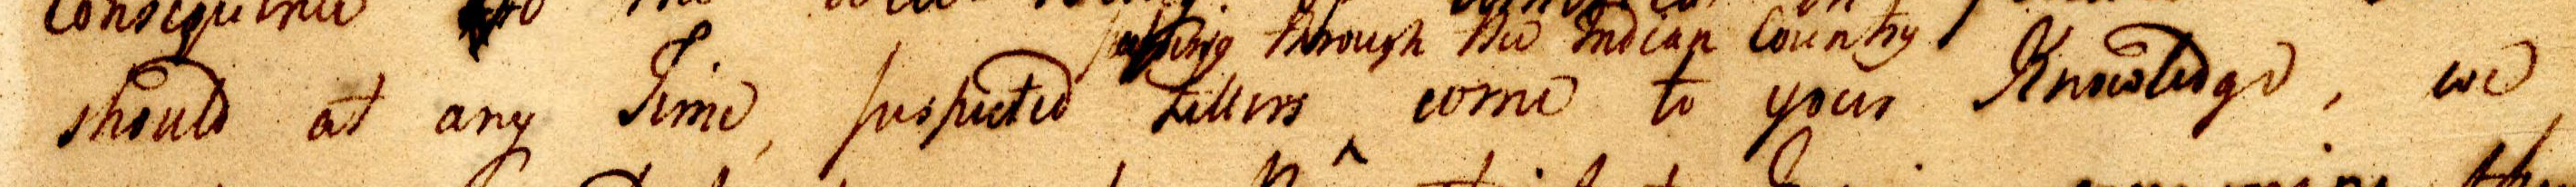should at any Time, suspected Letters ^ come to your Knowledge, we
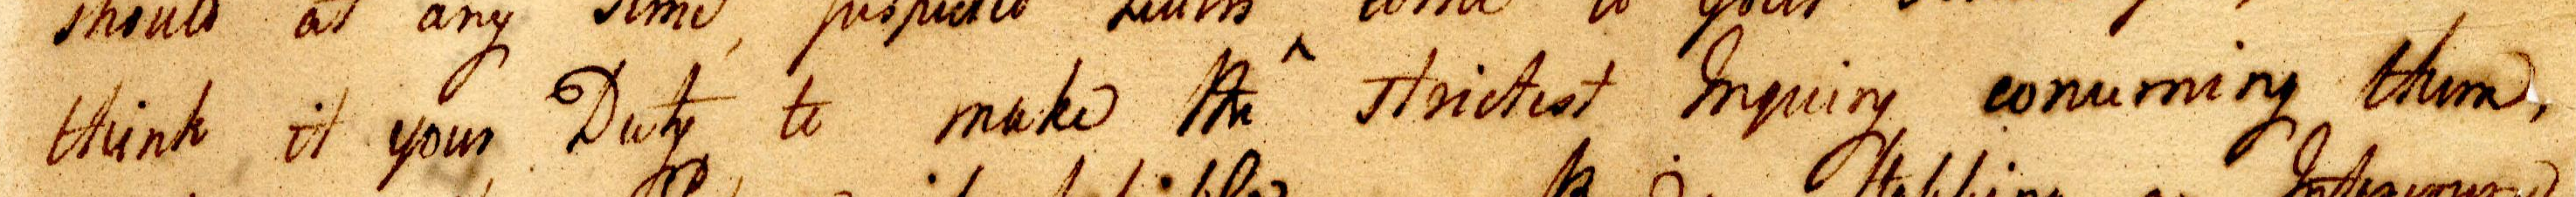think it your Duty to make the strictest Inquiry concerning them,
